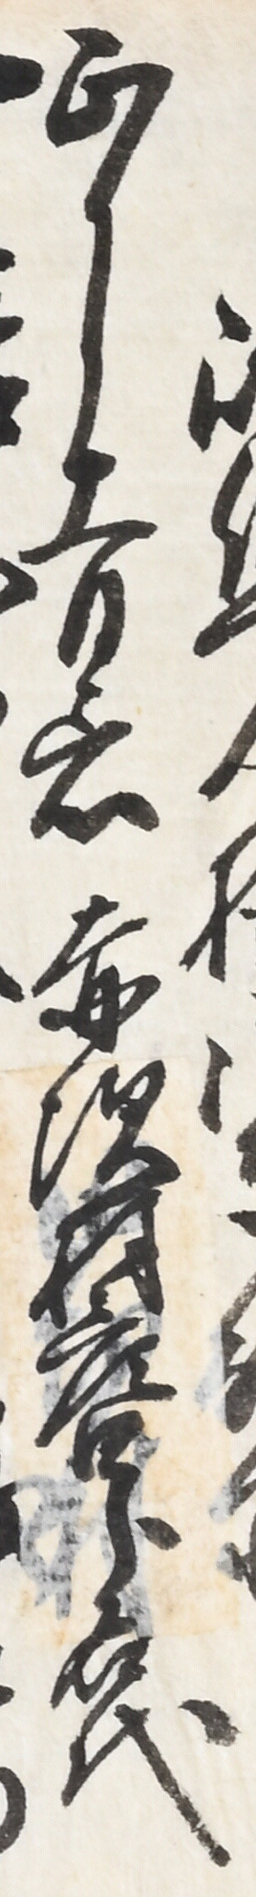正月十一日着赤次村彦四郎名代
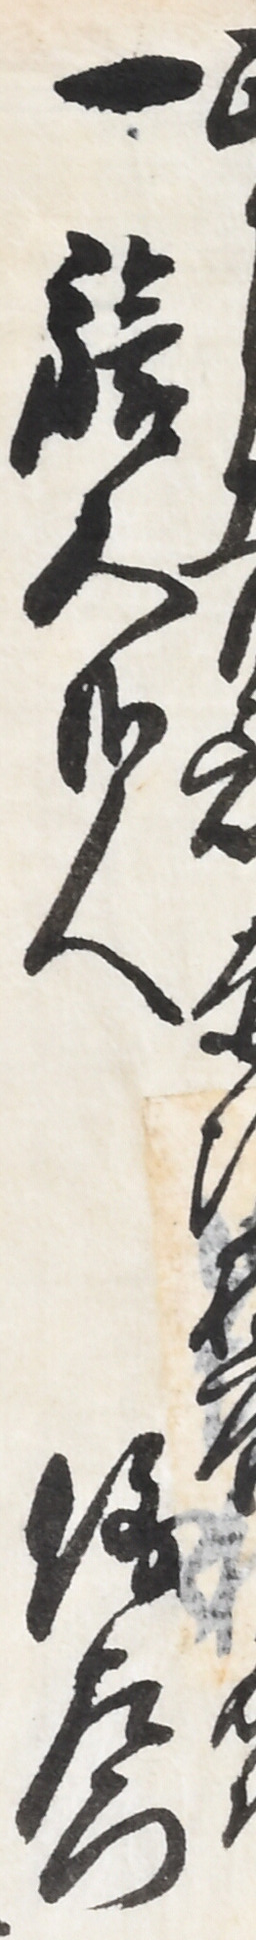一旅人弐人儀左衛門
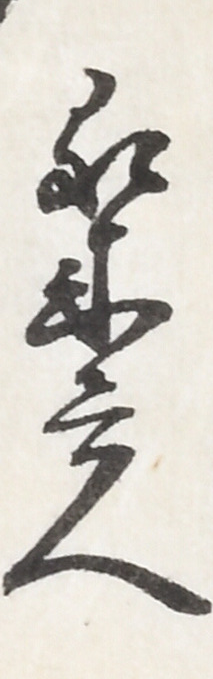家来壱人
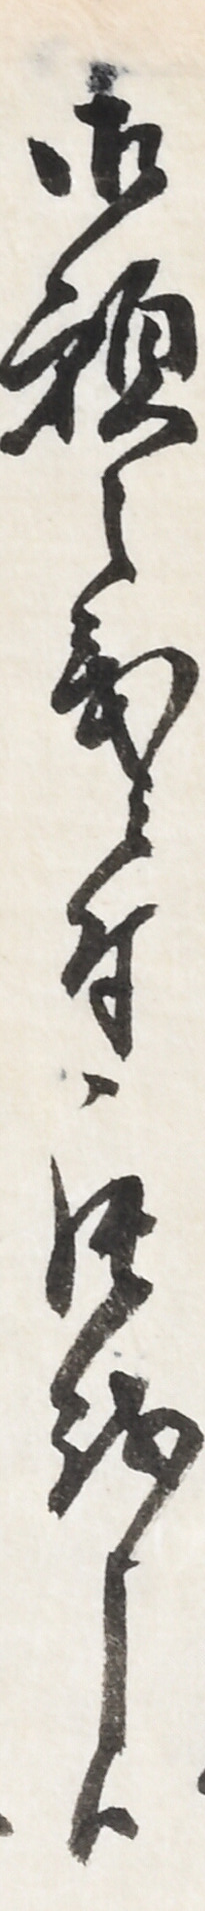御願之義ニ付罷越申候
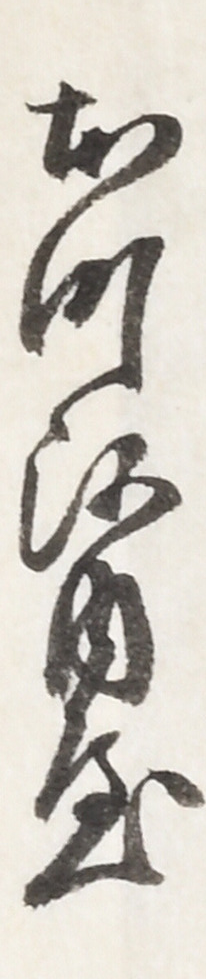本町河内屋
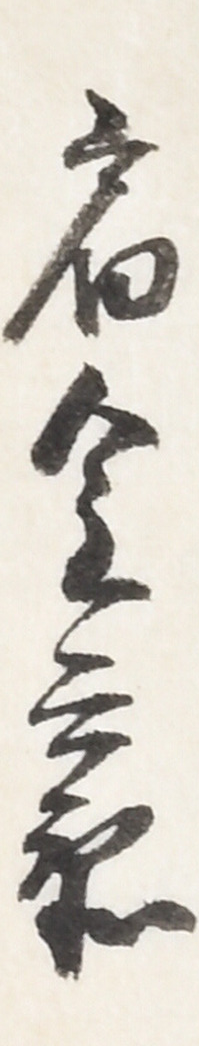宿金兵衛
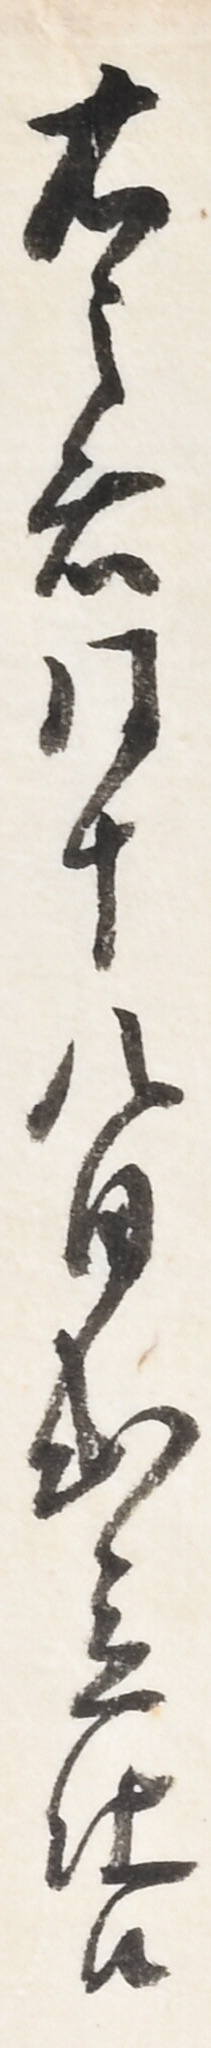右之者同十八日出立仕候
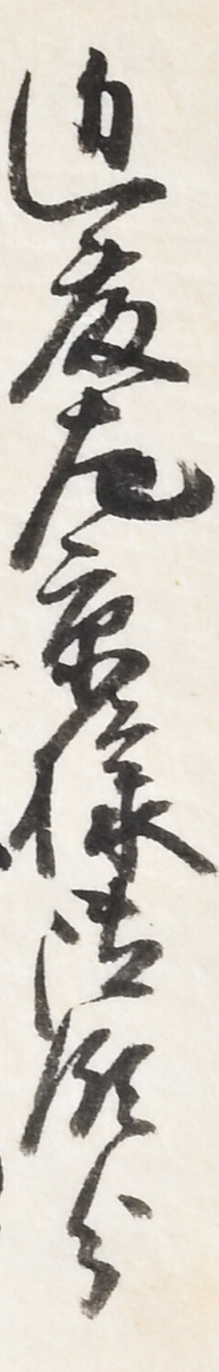近藤左京様御領分
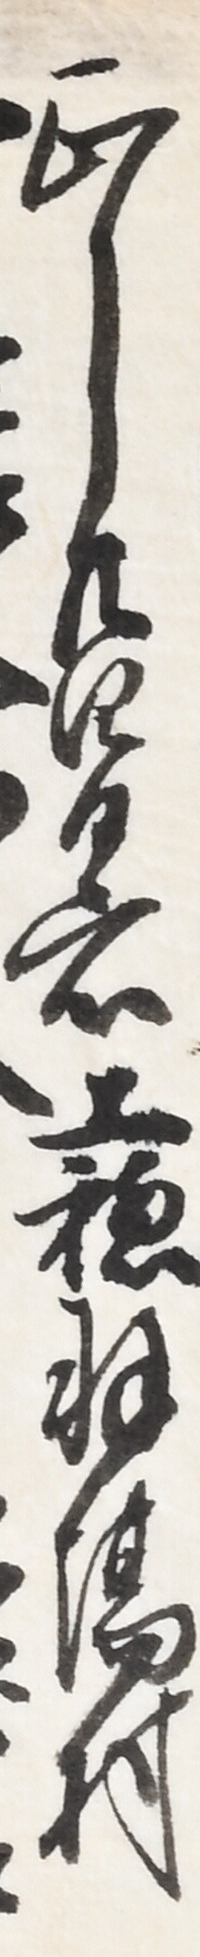正月廿四日着上穂羽場村
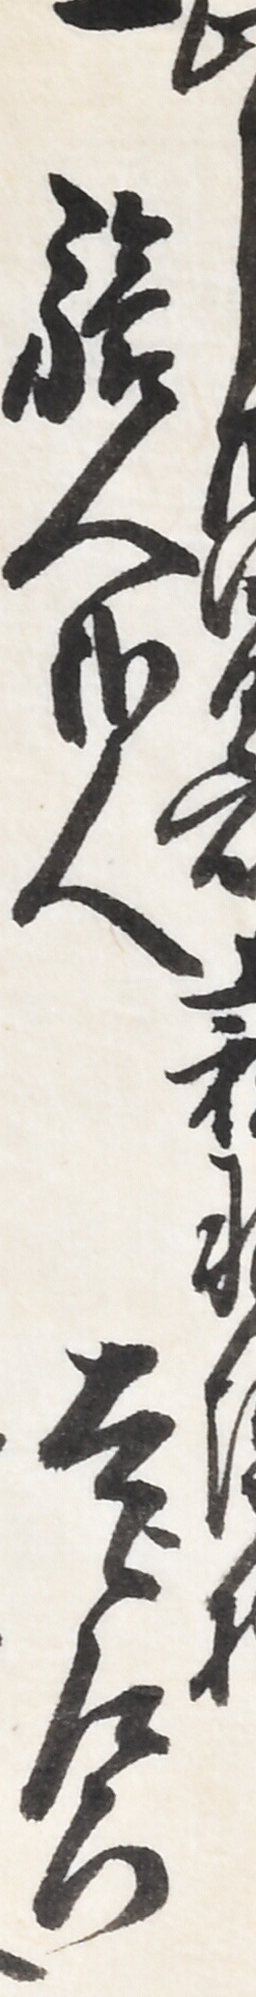一旅人弐人太郎左衛門
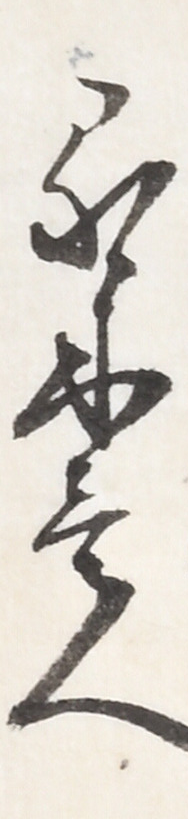家来壱人
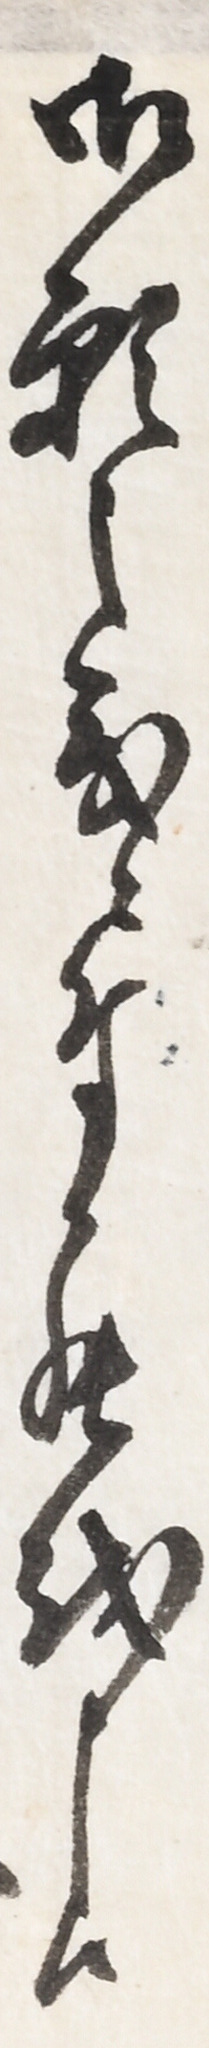御願之義ニ付罷越申候
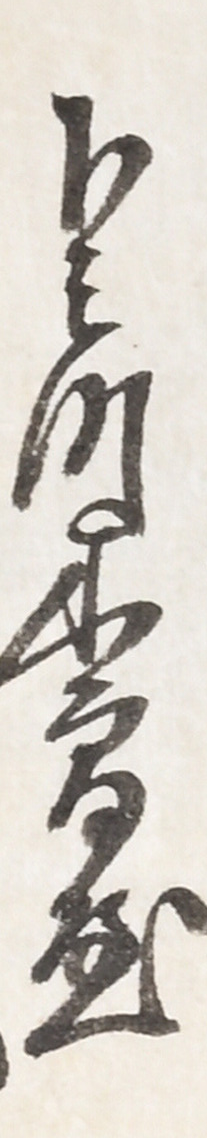下モ町木曽屋
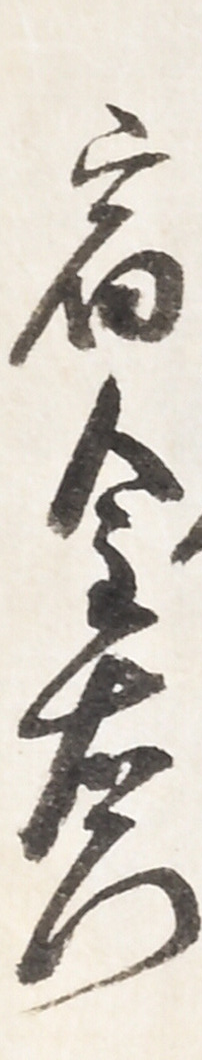宿金右衛門
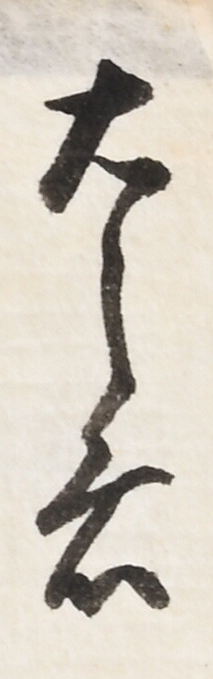右之者
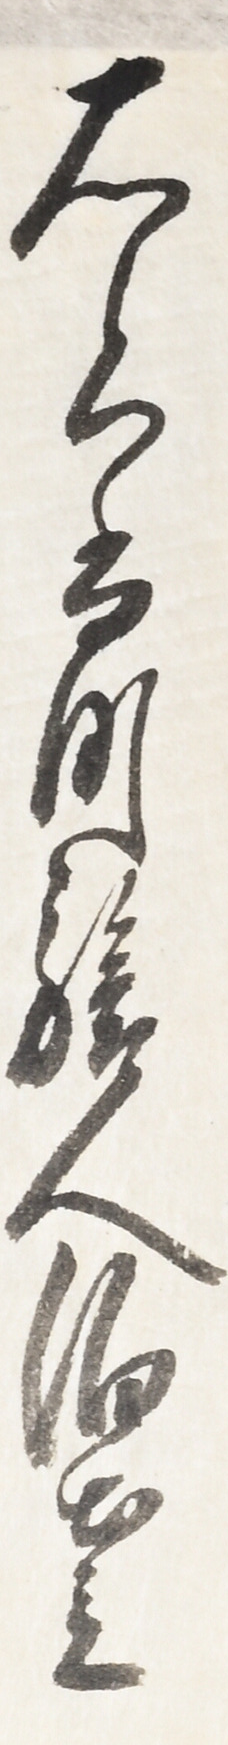右者当町旅人泊出立
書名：旅人泊控帳
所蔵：伊那市立高遠町図書館・合同会社AMANE
